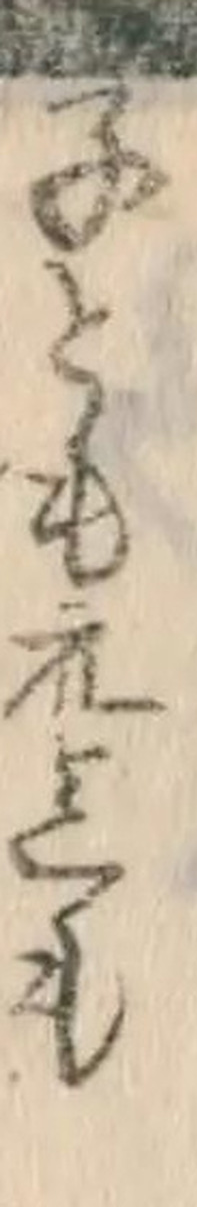子とも衆迄も
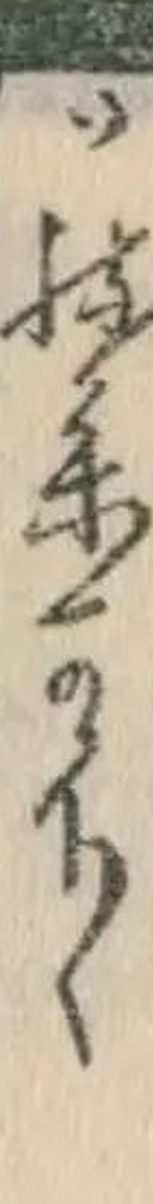御持参可被下候
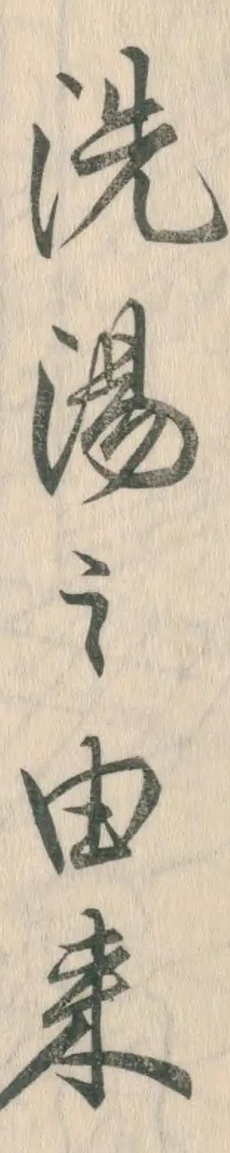洗湯之由来
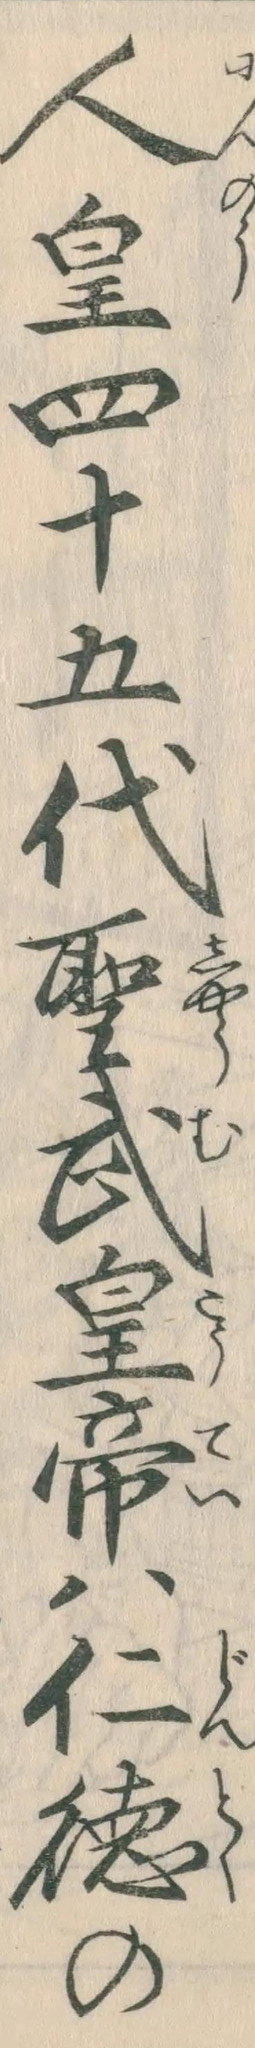人皇四十五代聖武皇帝は仁徳の
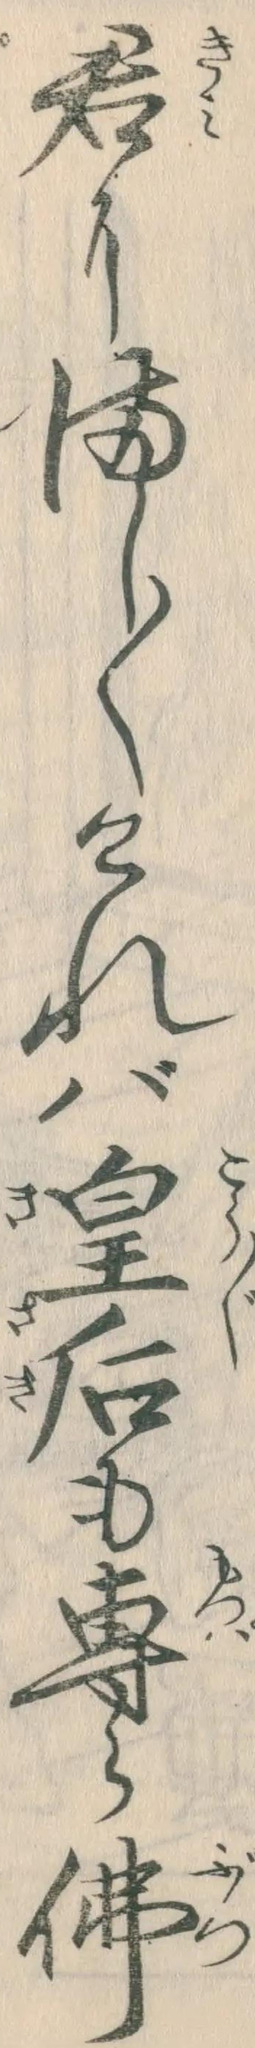君にまし〳〵ければ皇后も専ら仏
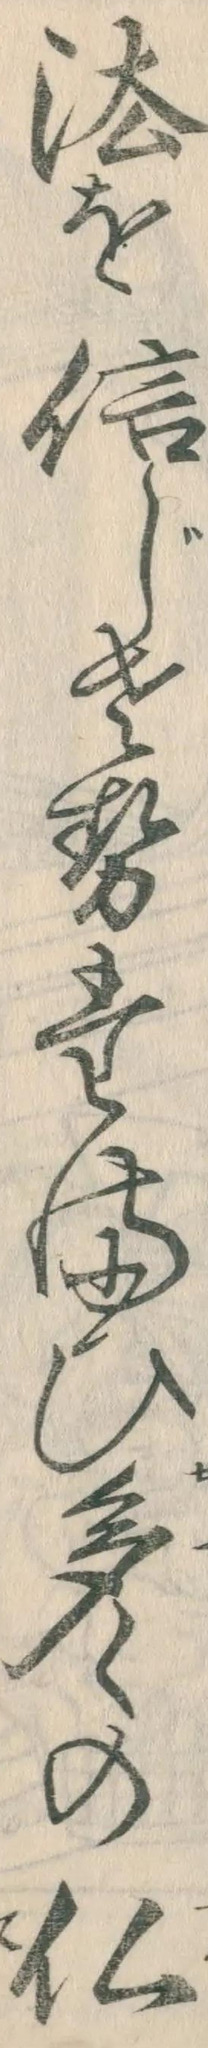法を信じさ勢たまひ多くの仏
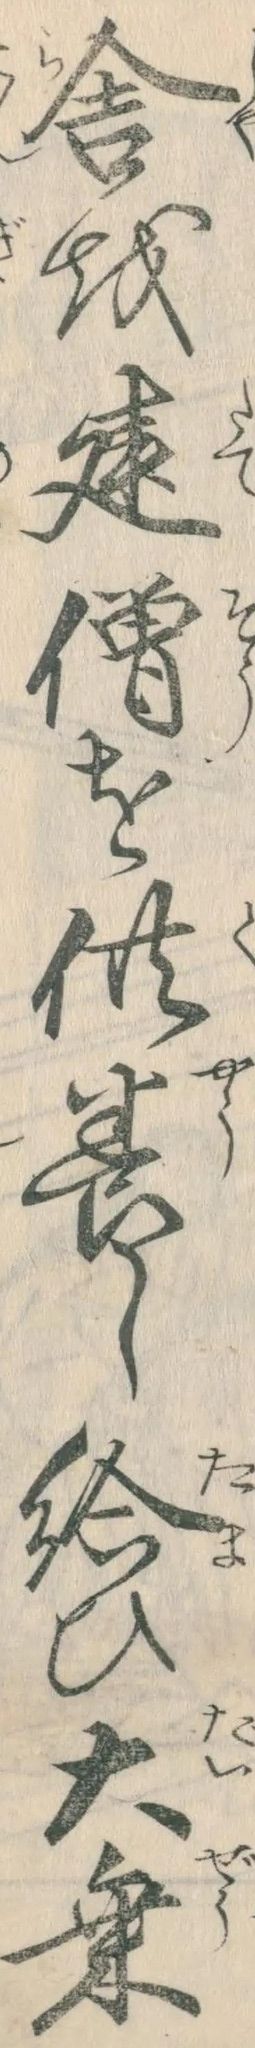舎を建僧を供養し給ひ大乗
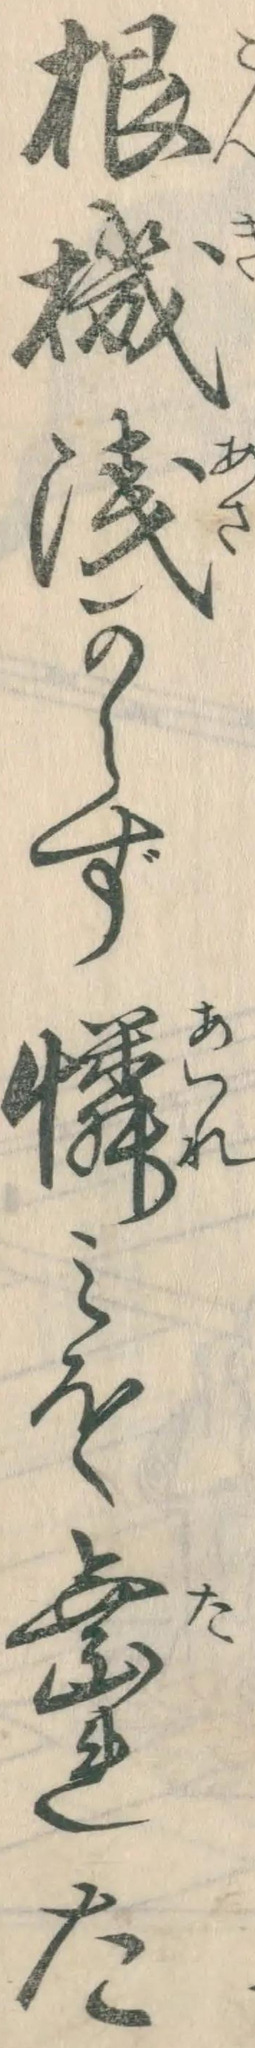根機浅からず憐みを垂れた

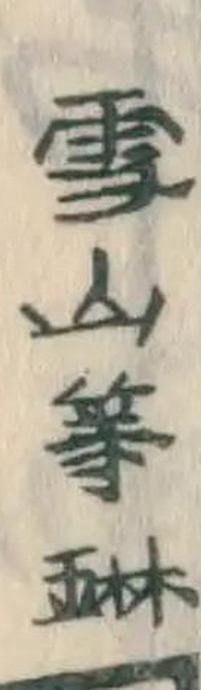雪山等琳

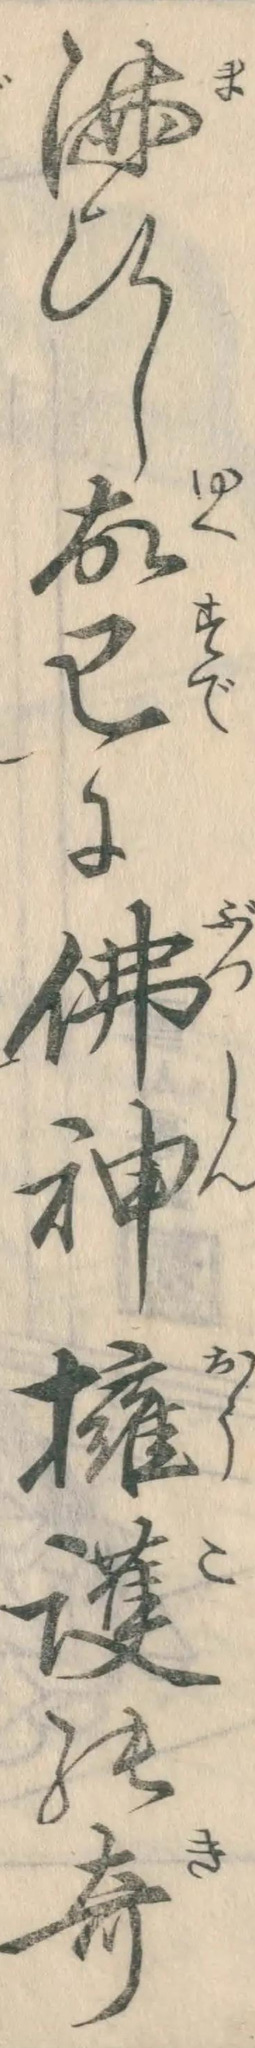満ひし故已に仏神擁護の奇
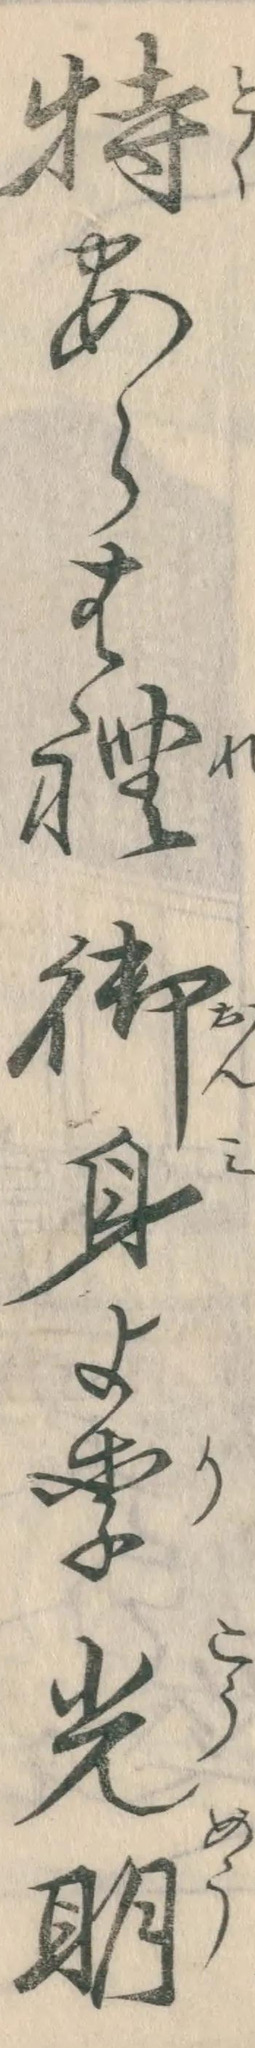特あらは礼御身よ李光明
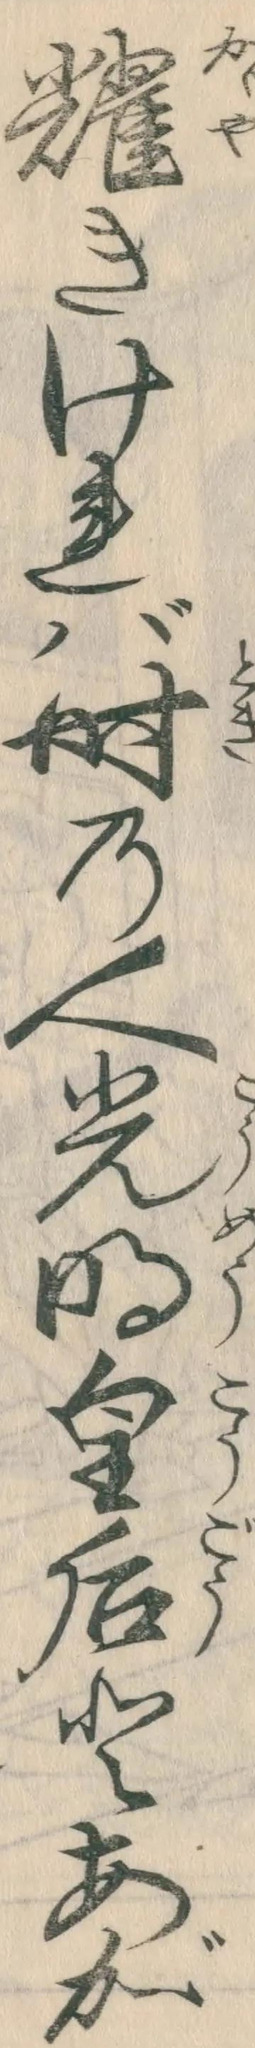燿きければ時の人光明皇后とあが
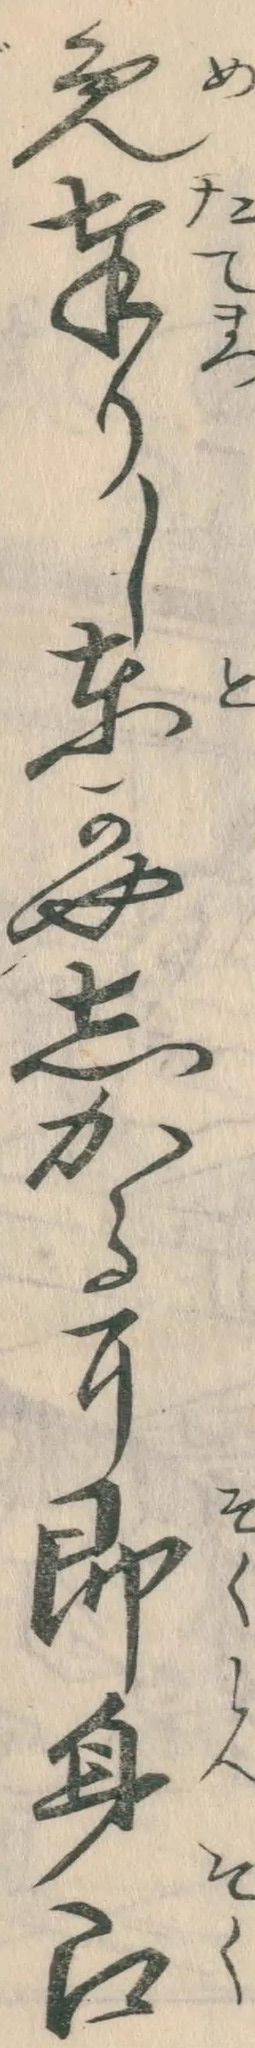免奉りし東かやしかるに即身即
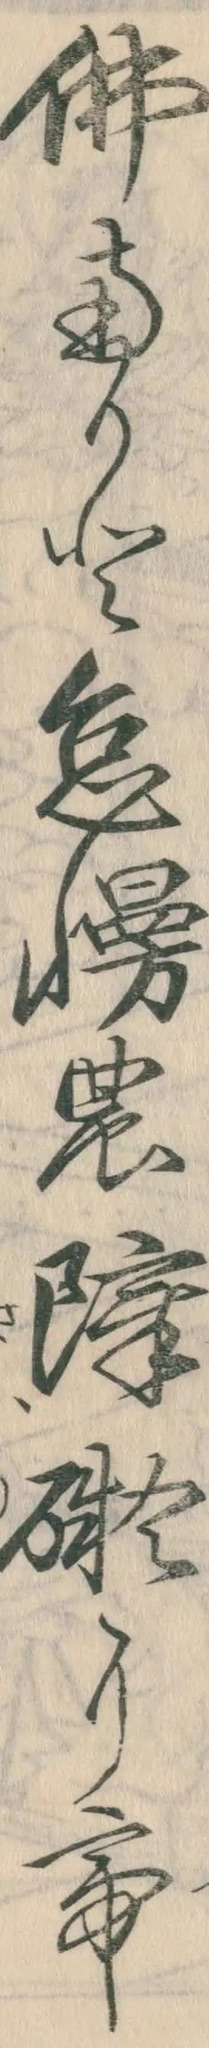仏南りと怠慢農障礙に帝
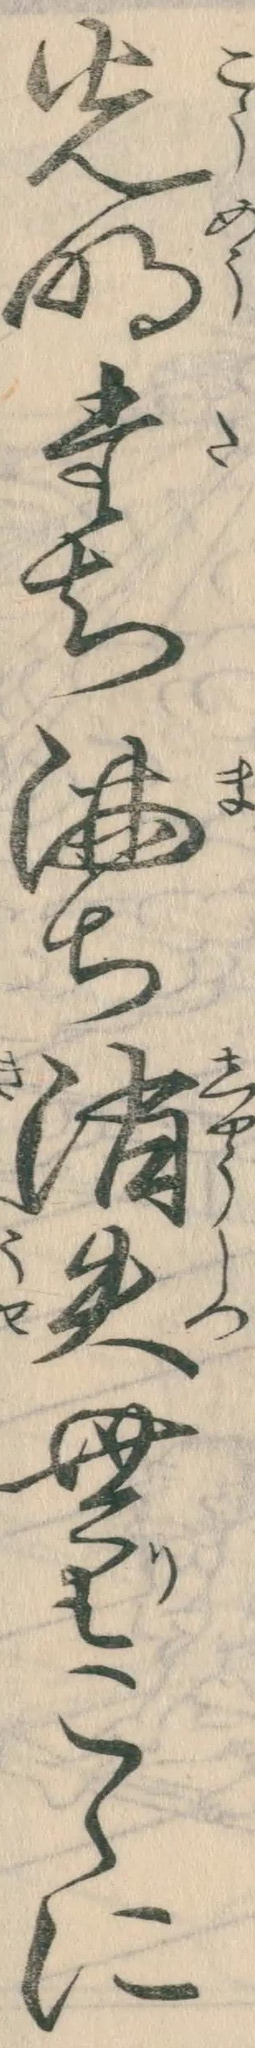光明堂ち満ち消失せ里こゝに
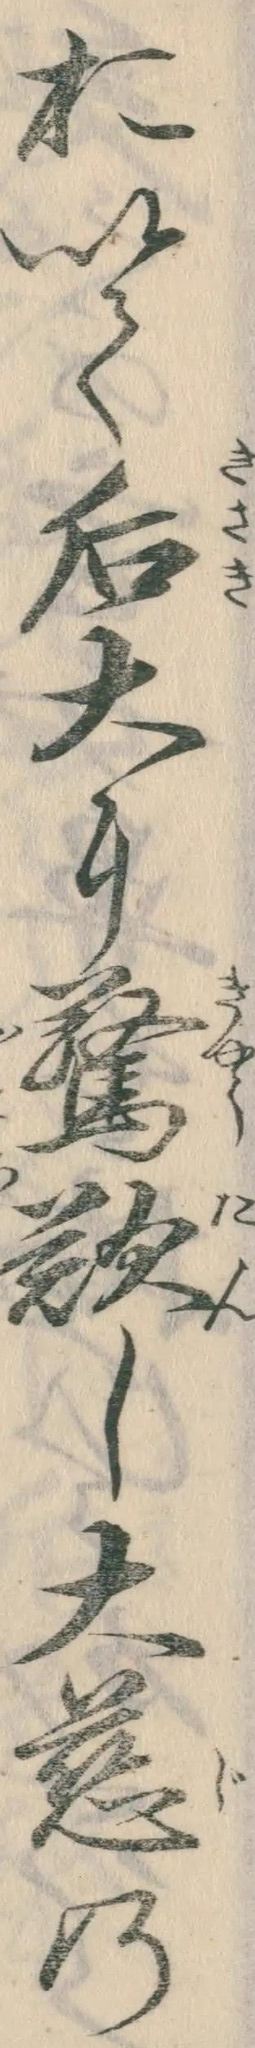おいて后大に驚歎し大慈の
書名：洗湯手引草
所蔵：国立国会図書館 National Diet Library, JAPAN
